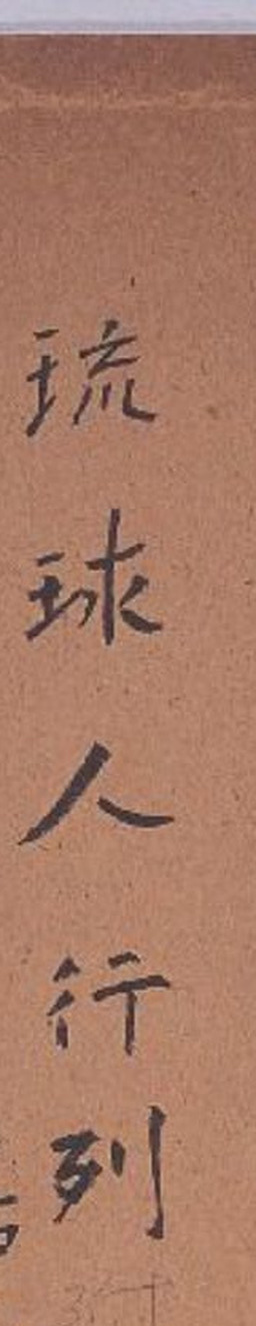琉球人行列
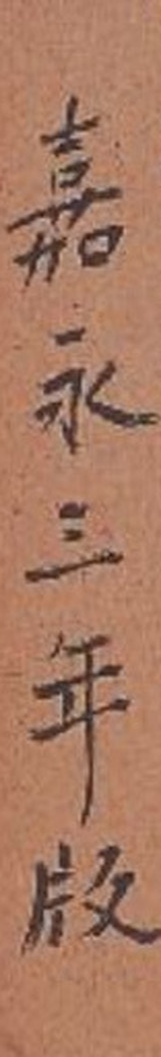嘉永三年版

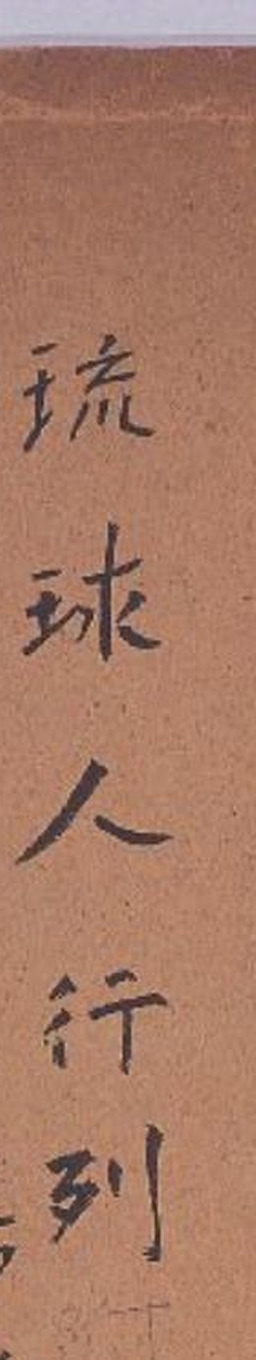琉球人行列
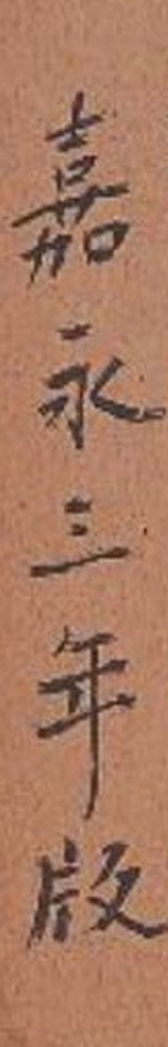嘉永三年版

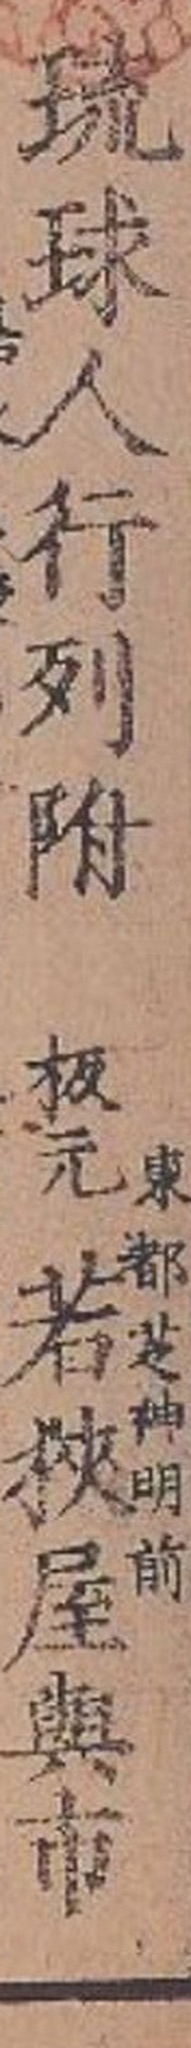琉球人行列附板元若狭屋與市
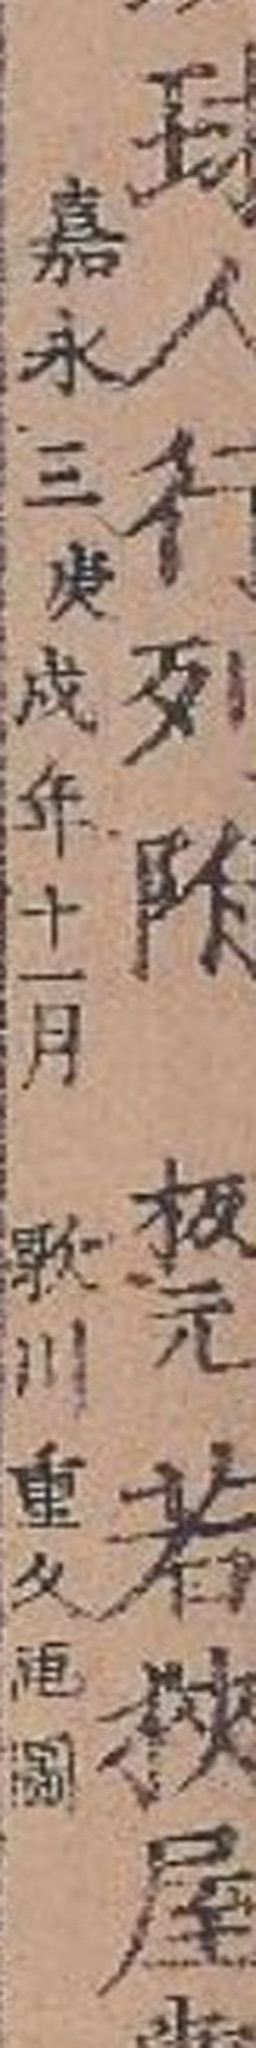嘉永三庚戌年十一月歌川重久画圖
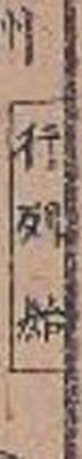行列始
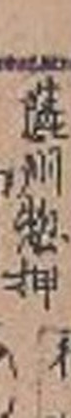薩州惣押
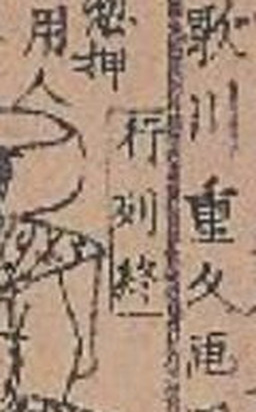行列始
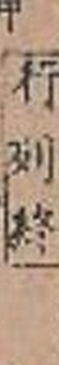行列始
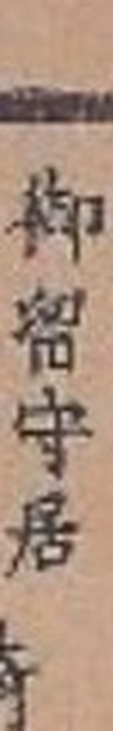御留守居
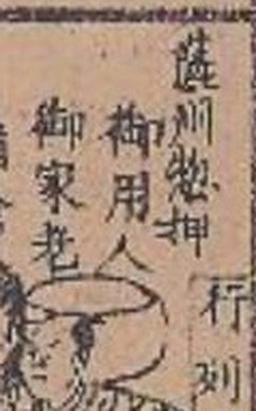御用人
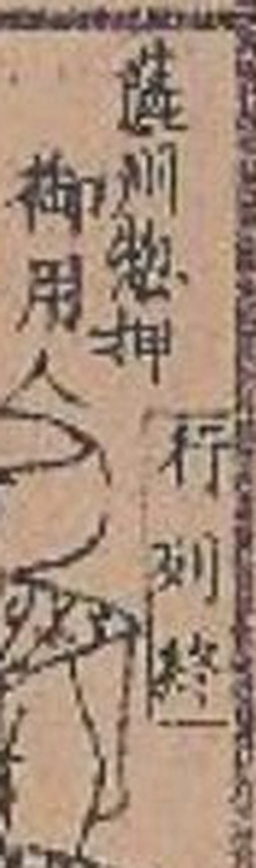御用人
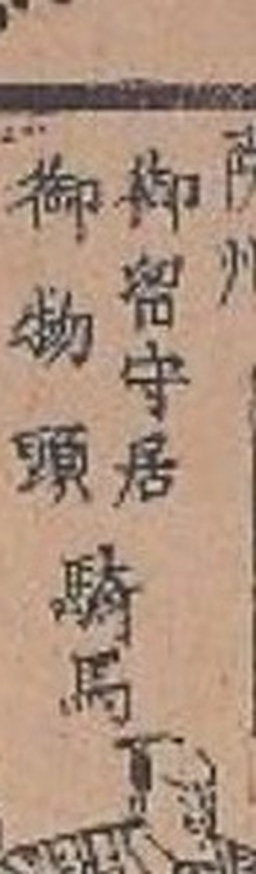御物頭騎馬
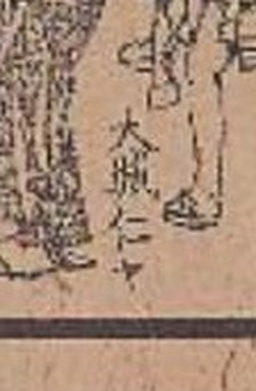大城仁ヤ
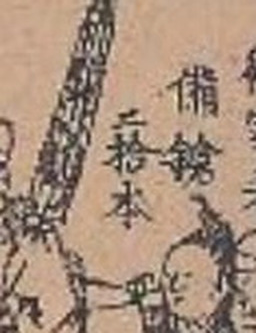二拾本
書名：琉球人行列附 嘉永三庚戌年十一月
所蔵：University of the Ryukyus Library
